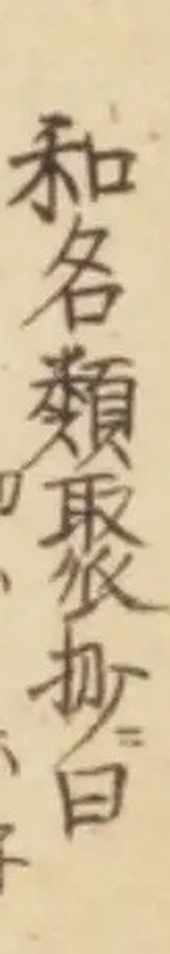和名類聚抄ニ曰
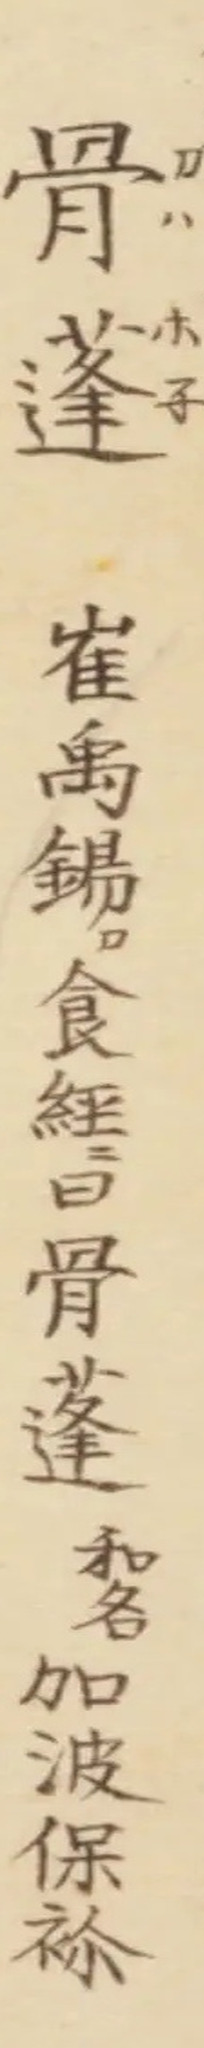骨蓬崔禹錫カ食経ニ骨蓬和名加波保祢
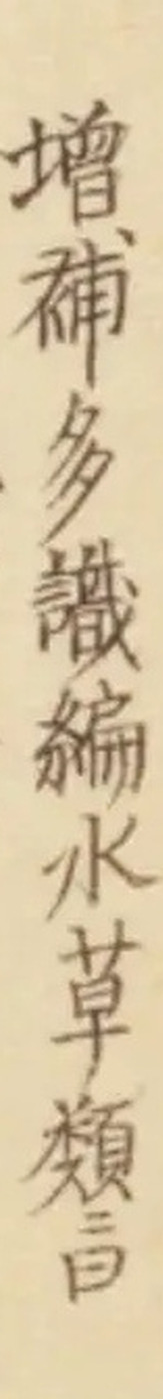増補多識編水草類ニ曰

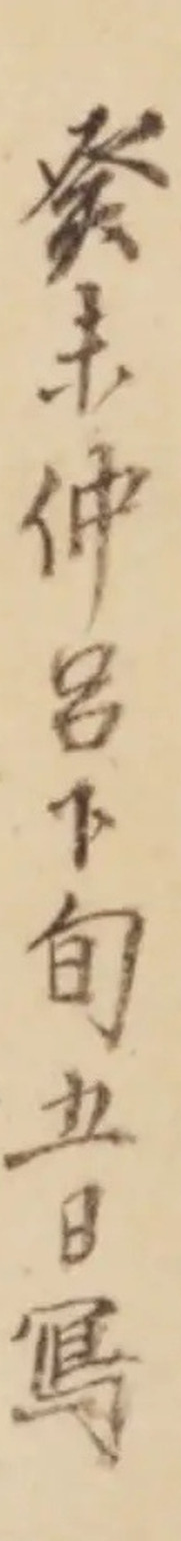癸未仲呂下旬五日寫
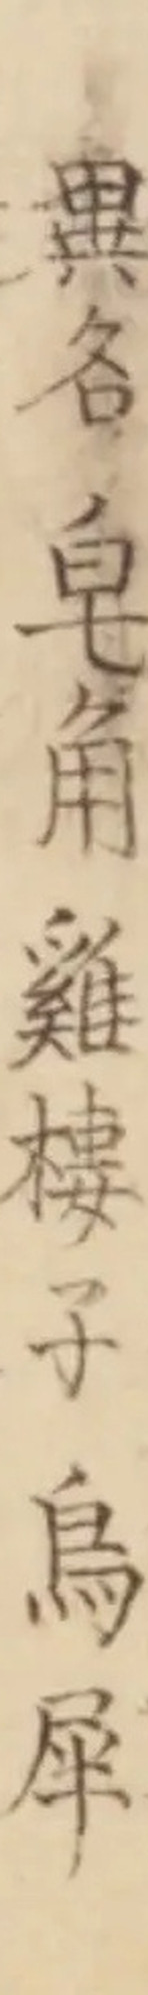異名皂角鶏棲子烏犀
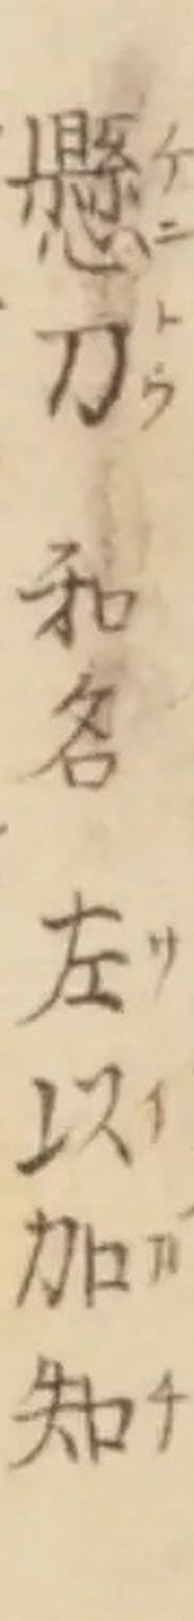懸刀和名左以加知
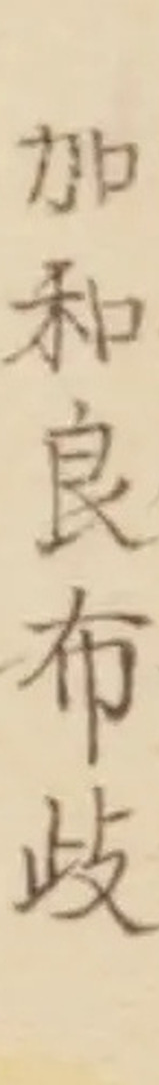加和料布岐
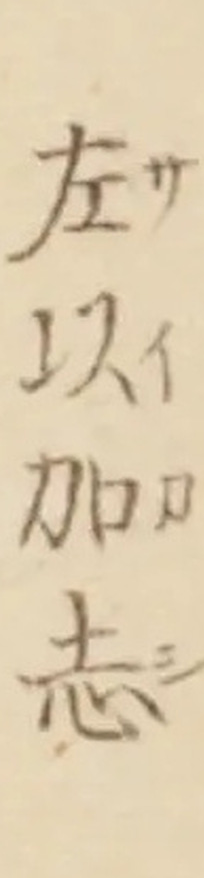左以加志
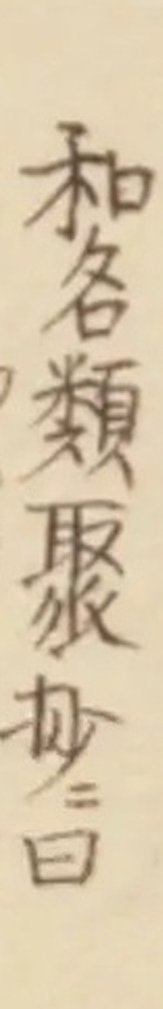和名類聚抄ニ曰
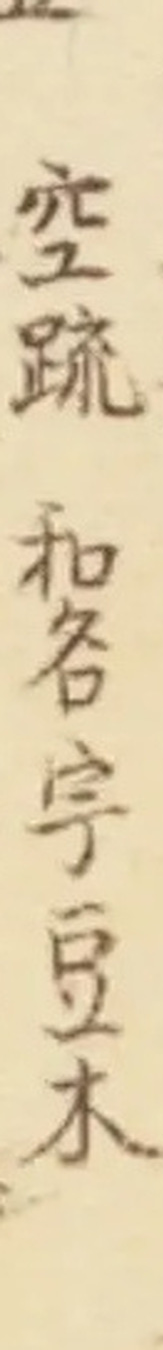楊櫨空和名宇豆木
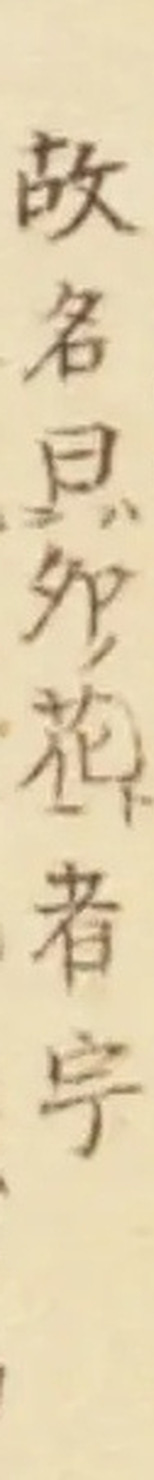故名曰ハ夘ノ花ト者宇
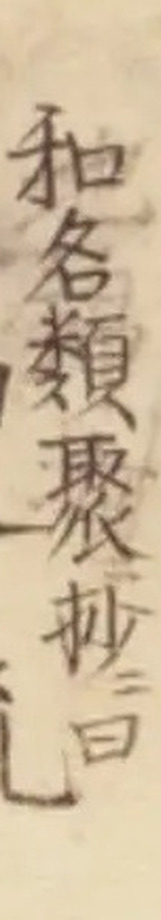和名類聚抄ニ曰
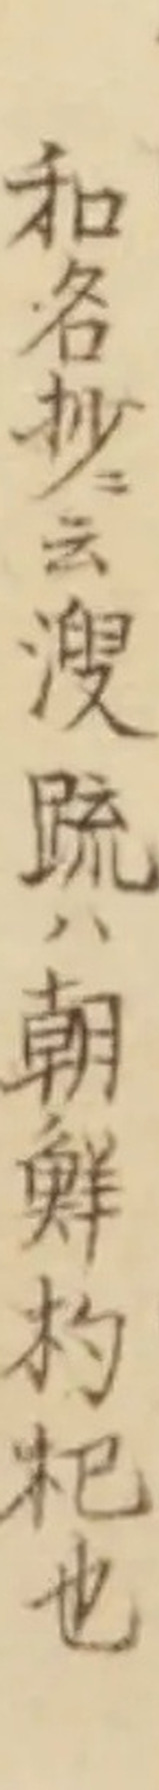和名抄ニ云溲ハ朝鮮杓杞也
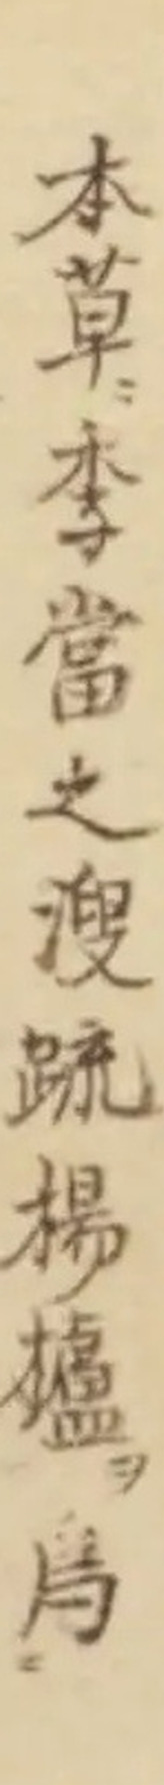本草ニ李當之溲楊櫨ヲ爲
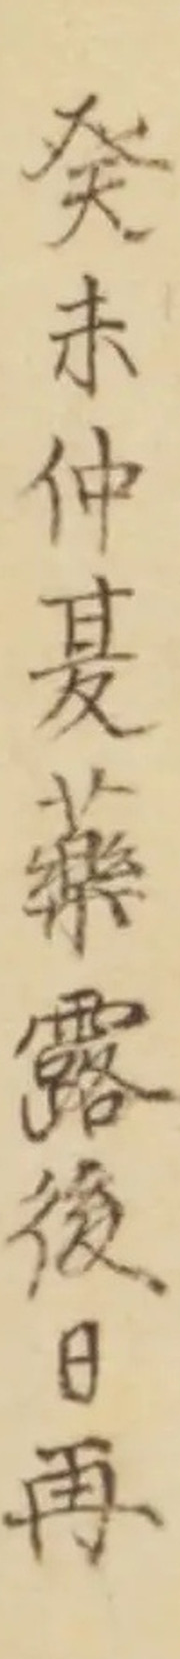癸未仲呂藥露後日

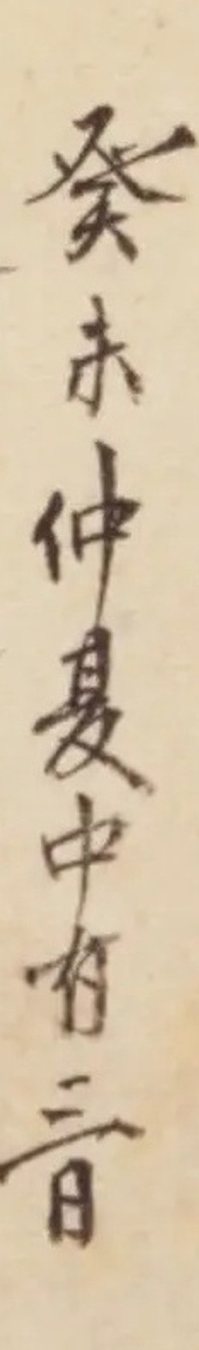癸未仲呂中有三日
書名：梅園草木花譜夏之部. 1
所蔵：国立国会図書館 National Diet Library, JAPAN
